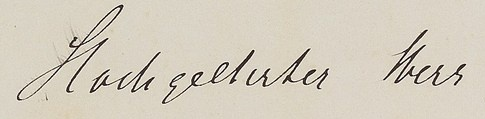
Hochgeehrter Herr
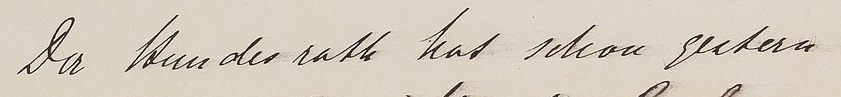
Der Bundesrath hat schon gestern
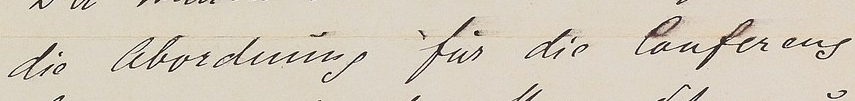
die Abordnung für die Conferenz
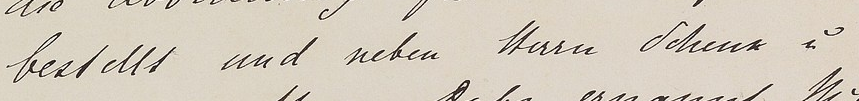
bestellt und neben Herrn Schenk u
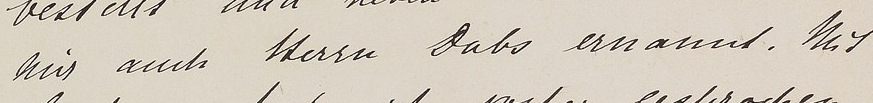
mir auch Herrn Dubs ernannt. Mit
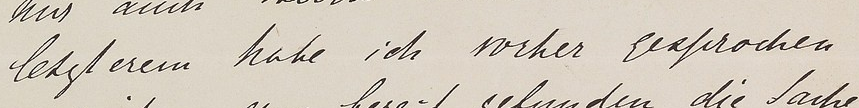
letzterem habe ich vorher gesprochen
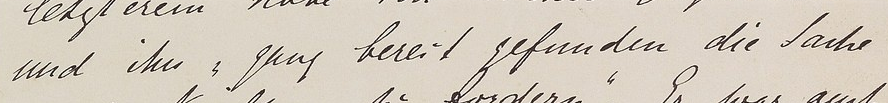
und ihn «ganz bereit gefunden die Sache
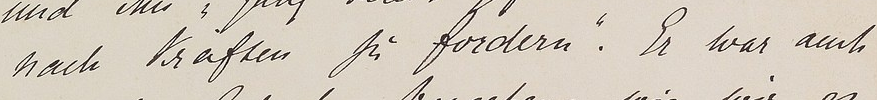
nach Kräften zu fördern». Er war auch
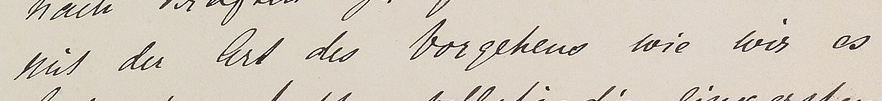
mit der Art des Vorgehens wie wir es
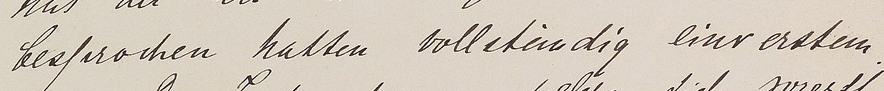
besprochen hatten vollständig einverstan-
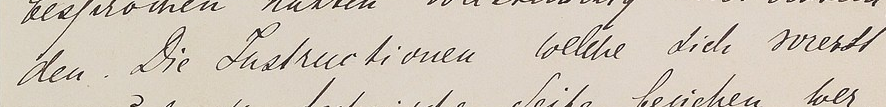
den. Die Instructionen welche sich vorerst
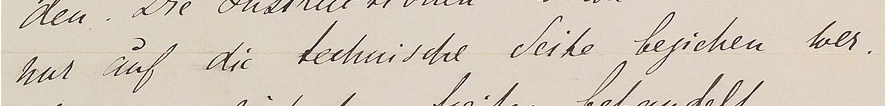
nur auf die technische Seite beziehen wer-
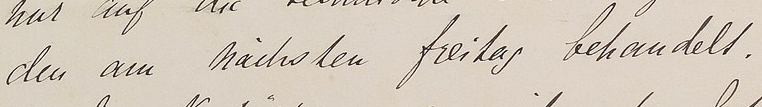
den am nächsten Freitag behandelt.
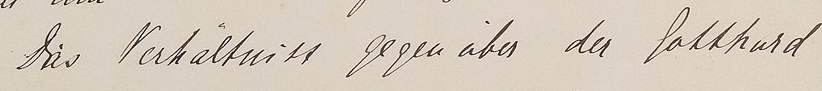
Das Verhältniss gegenüber der Gotthard-
